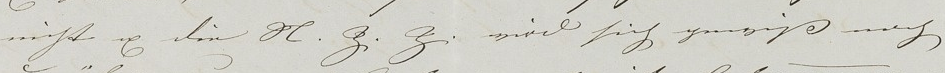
nicht & die N.Z.Z. wird sich gewiß noch
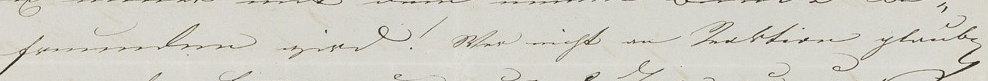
freunden wird! Wer nicht an Reaktion glauben
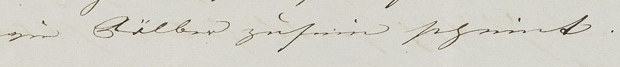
wie Fälber zusein scheint.
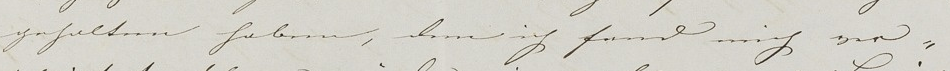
gehalten haben, den ich fand mich ver-
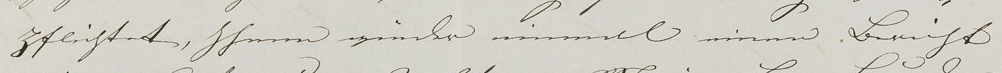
pflichtet, Ihnen wieder einmal einen Bericht
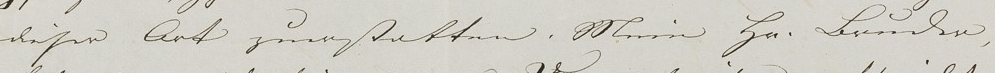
dieser Art zuerstatten. Mein Hr. Bruder,
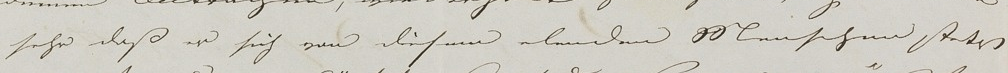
sehr daß er sich von diesem elenden Menschen stets
